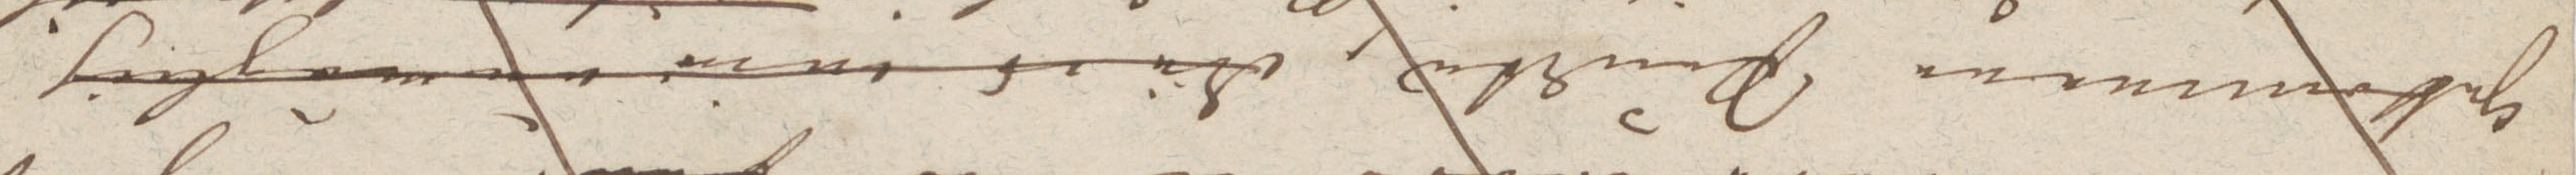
früheren dem was früher bereits zwischen
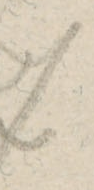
86.
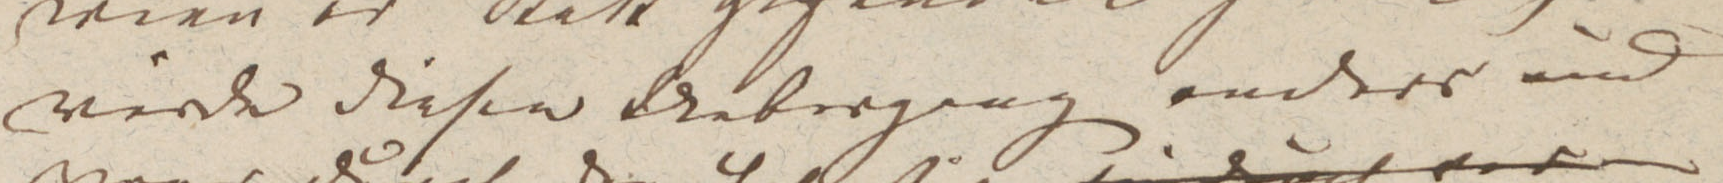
würde diesen Uebergang anders und
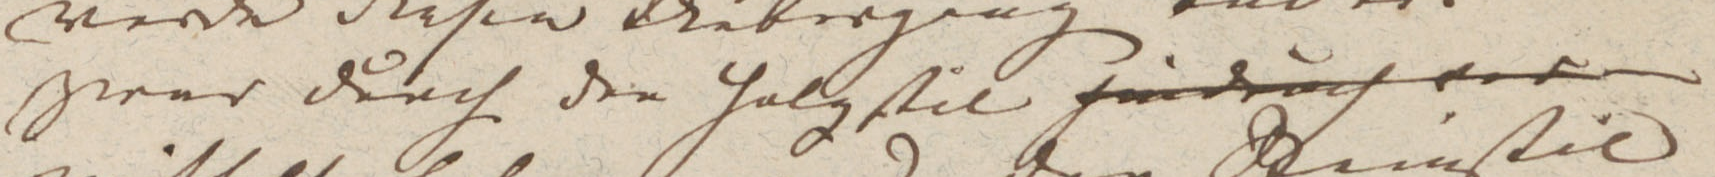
zwar durch den Holzstil hindurch ver-
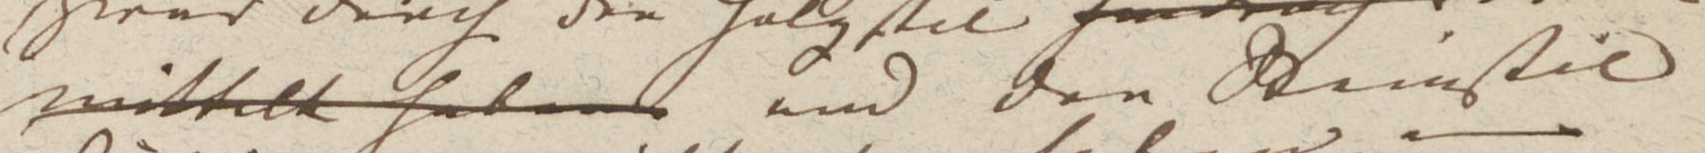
mittelt haben und den Steinstil
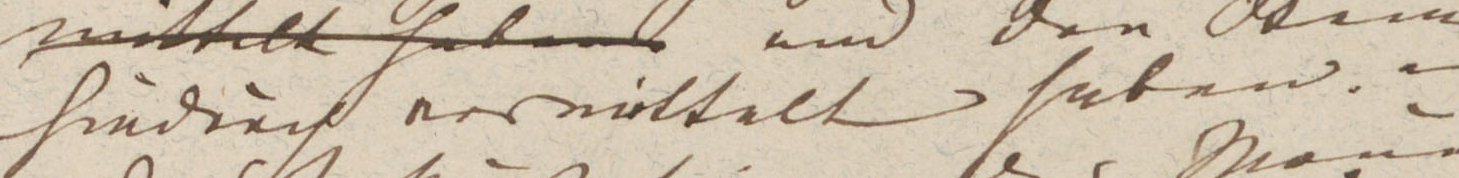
hindurch vermittelt haben. –
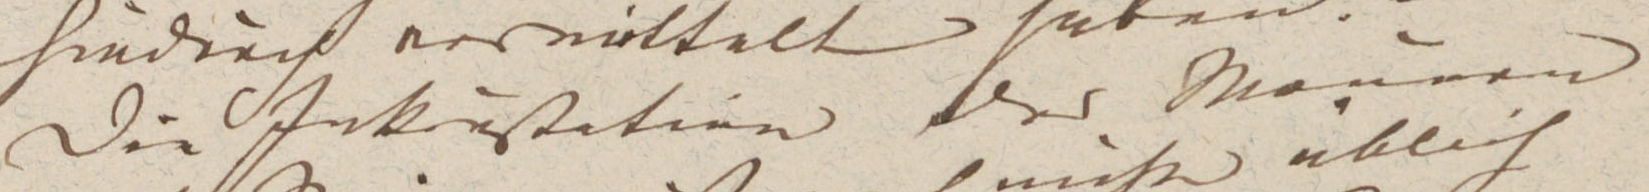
Die Inkrustation der Mauern
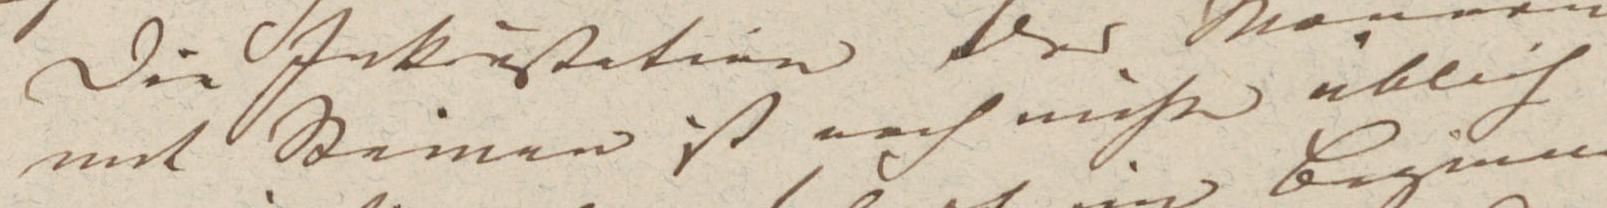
mit Steinen ist noch nicht üblich
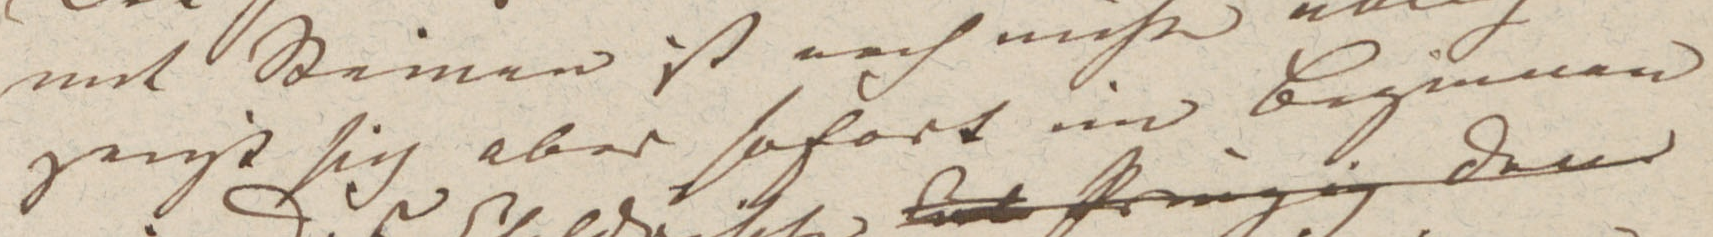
zeigt sich aber sofort im Beginnen
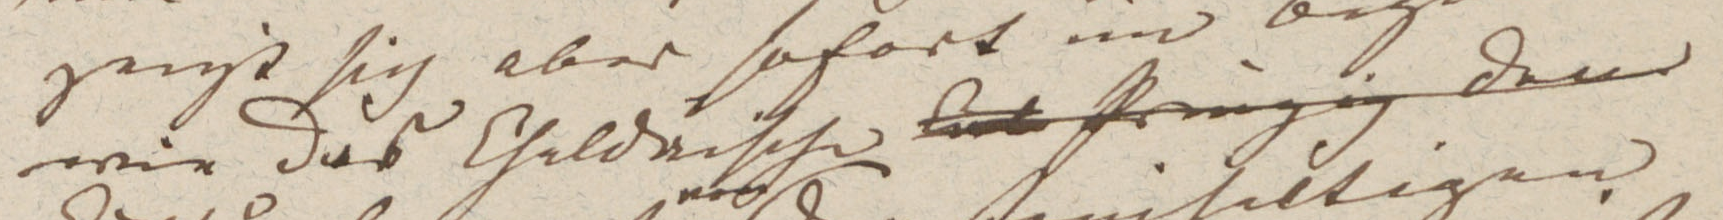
wie das Chaldäische Cul Prinzip de
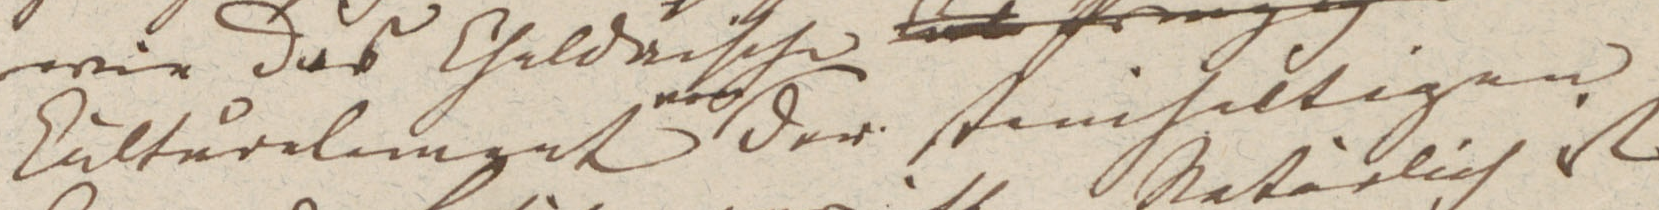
Culturelement von der steinhaltigen
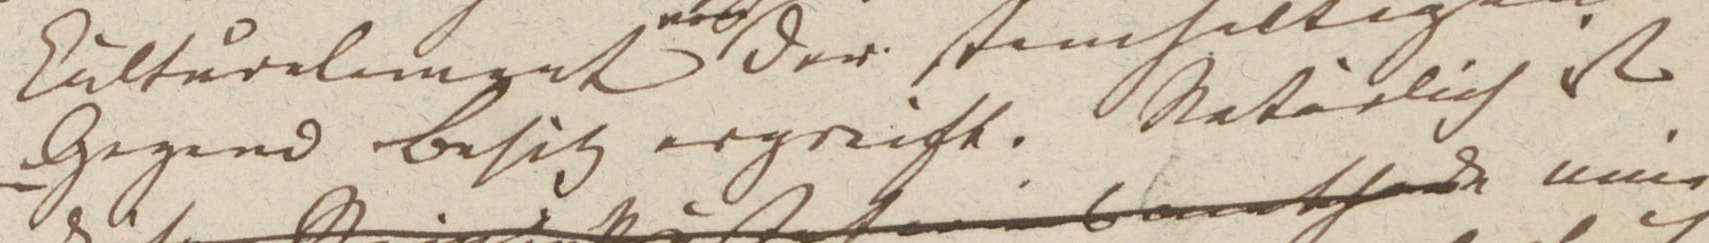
%Gegend Besitz ergreift. Natürlich ist
